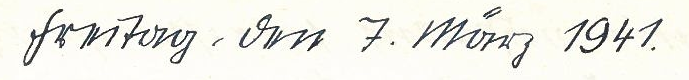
Freitag, den 7. März 1941.
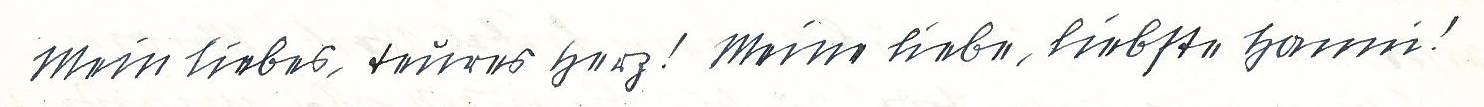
Mein liebes, teures Herz! Meine liebe, liebste !
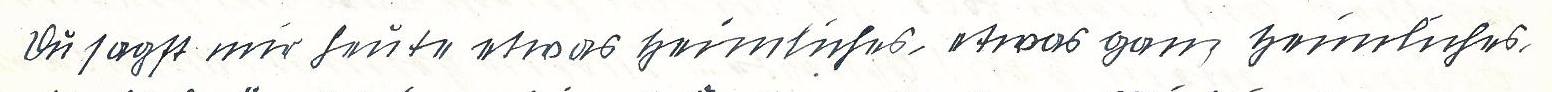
Du sagst mir heute etwas Heimliches, etwas ganz Heimliches,
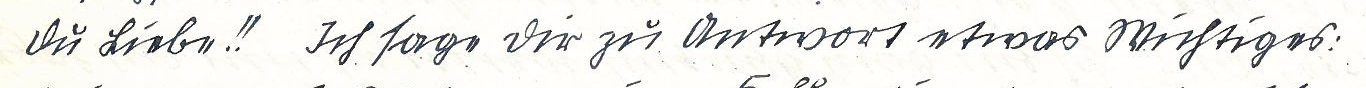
Du Liebe!! Ich sage Dir zur Antwort etwas Wichtiges:
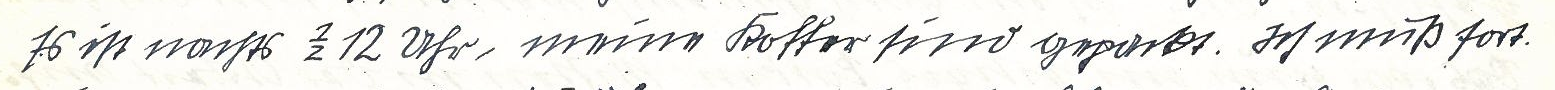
Es ist nachts ½ 12 Uhr, meine Koffer sind gepackt. Ich muß fort.
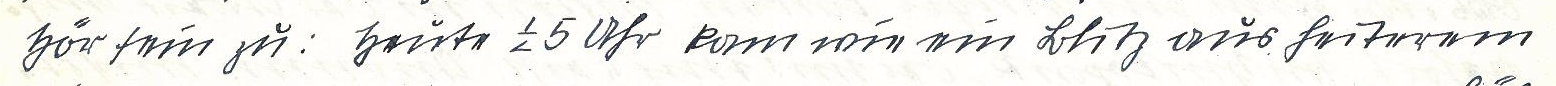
Hör fein zu: Heute ½ 5 Uhr kam wie ein Blitz aus heiterem
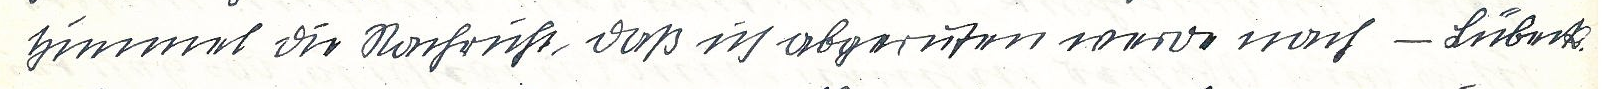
Himmel die Nachricht, daß ich abgerufen werde nach – Lübeck.
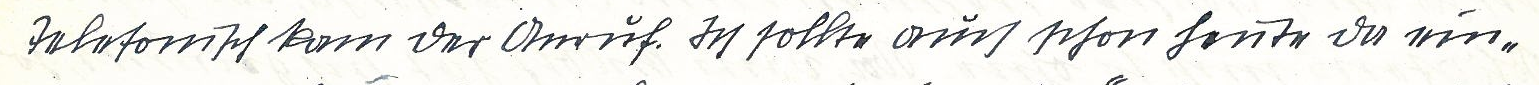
Telefonisch kam der Anruf. Ich sollte auch schon heute da ein¬
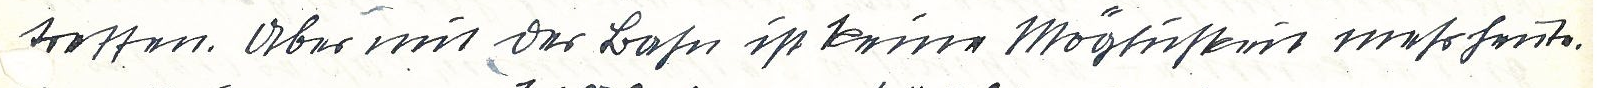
treffen. Aber mit der Bahn ist keine Möglichkeit mehr heute.
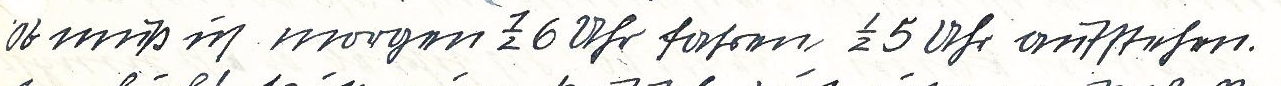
o muss ich morgen ½ 6 Uhr fahren, ½ 5 Uhr aufstehen.
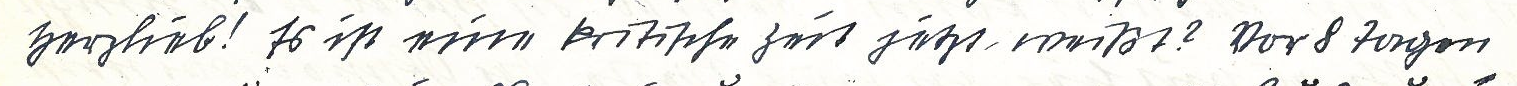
Herzlieb! Es ist eine kritische Zeit jetzt, weißt? Vor 8 Tagen
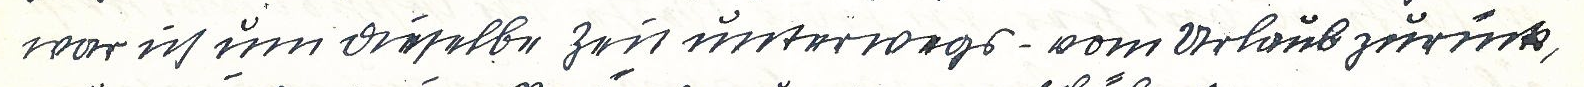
war ich um dieselbe Zeit unterwegs – vom Urlaub zurück,
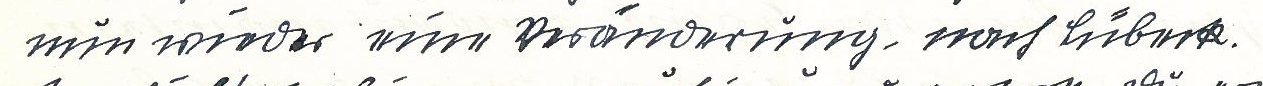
nun wieder eine Veränderung, nach Lübeck.
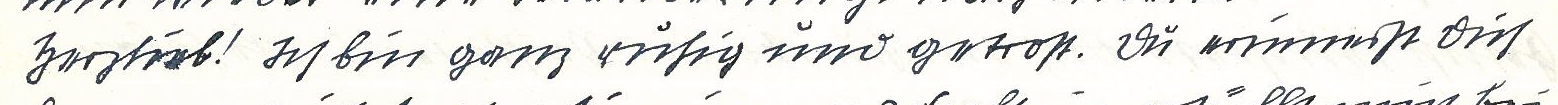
Herzlieb! Ich bin ganz ruhig und getrost. Du erinnerst Dich
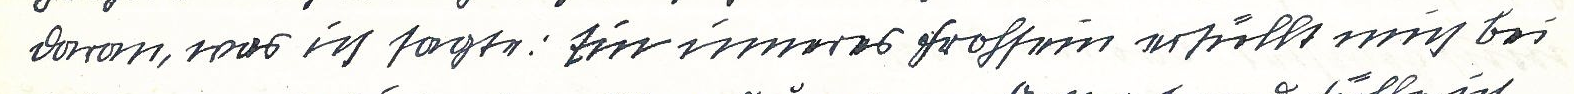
daran, was ich sagte: Ein inneres Frohsein erfüllt mich bei
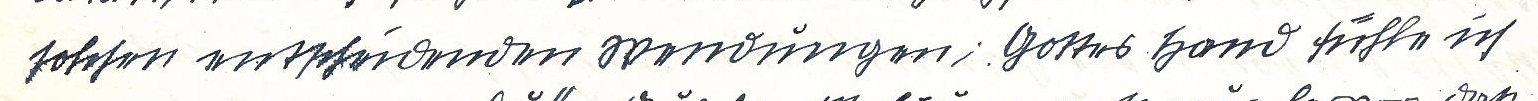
solchen entscheidenden Wendungen; Gottes Hand fühle ich
